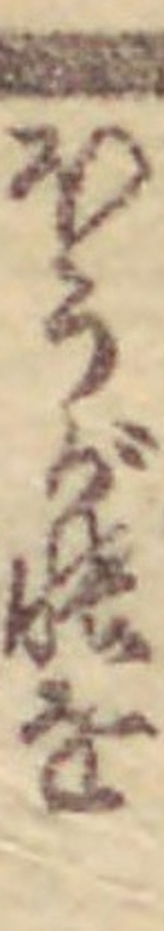ほうが帳を
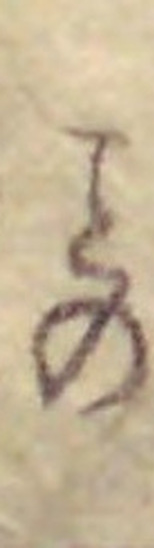ことの
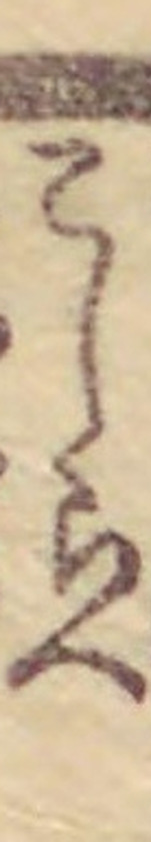こしらへ
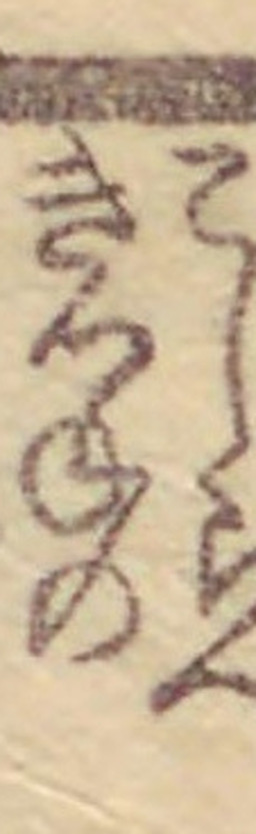きつねの
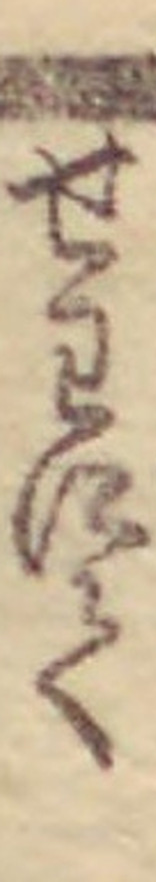せわにて
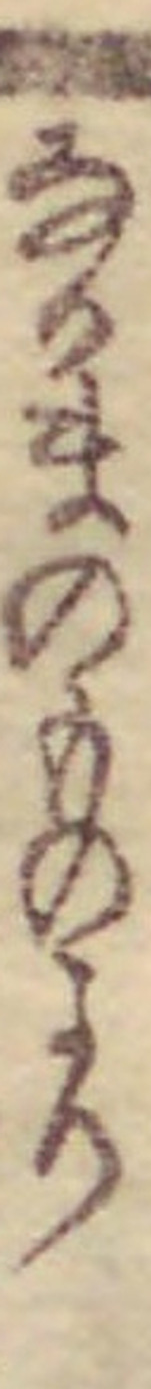なかまのものより
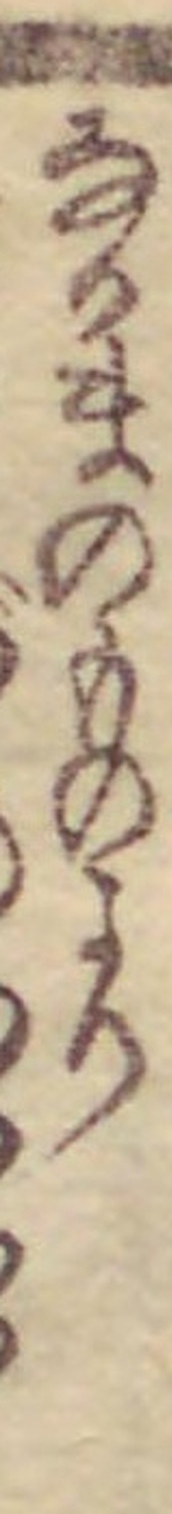なかまのものより
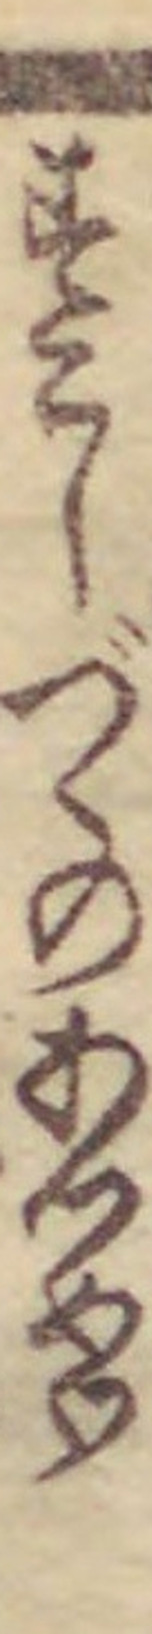すこしづゝのあつめつ
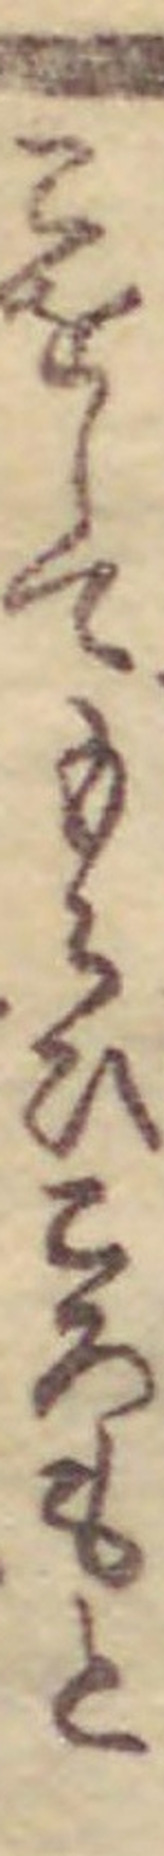こをしてもらひころもと
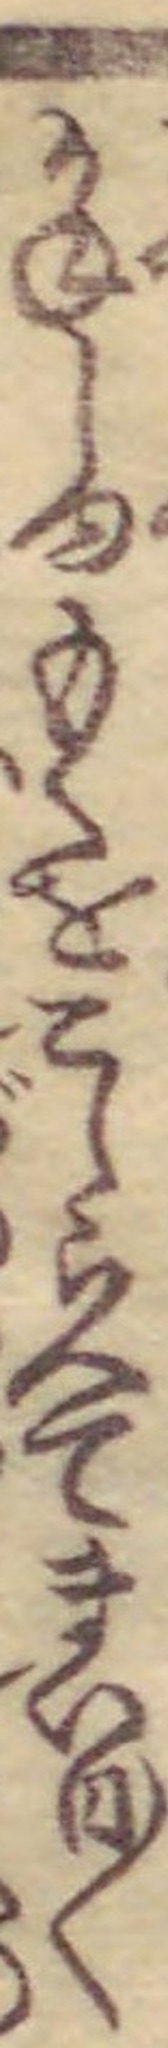かねしゆもくをこしらへてまい日〳〵
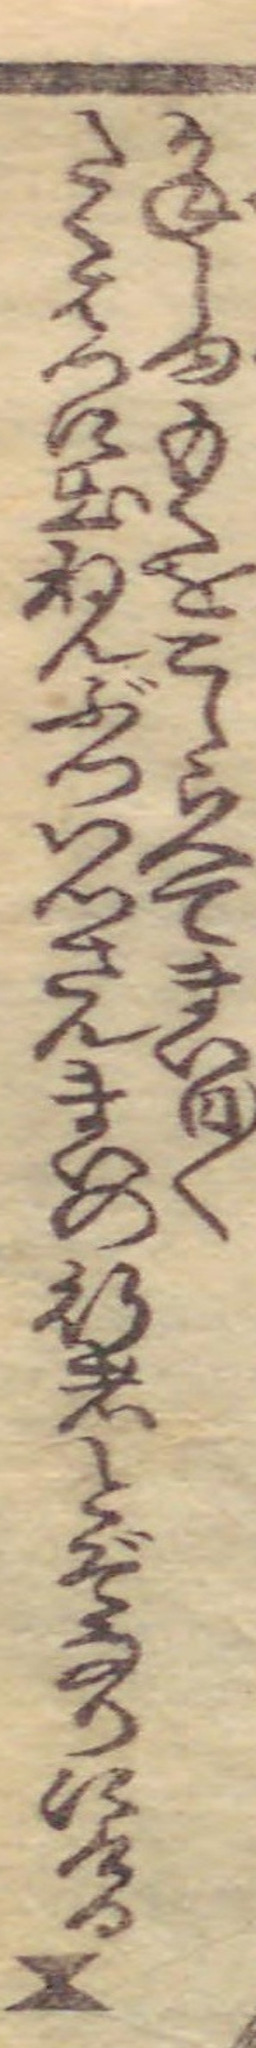たくはつに出ねんぶついつさんまいの行者とぞなりにける▼▲

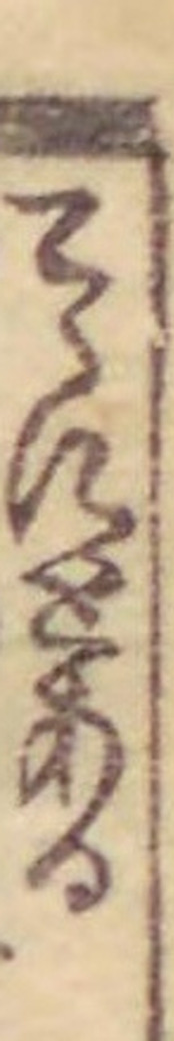こゝにとある
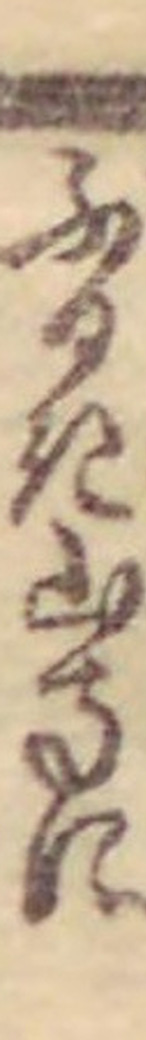ふるき山寺に
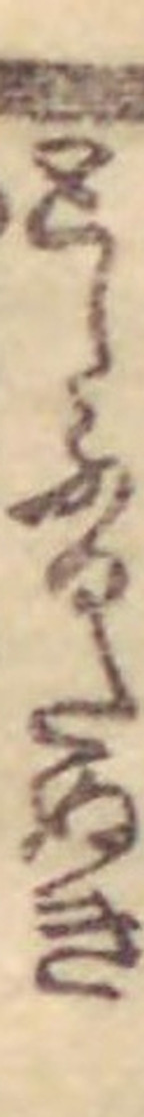としふるたぬき
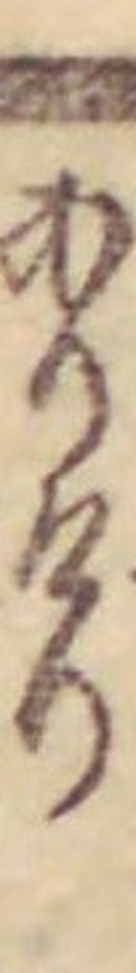ありけり
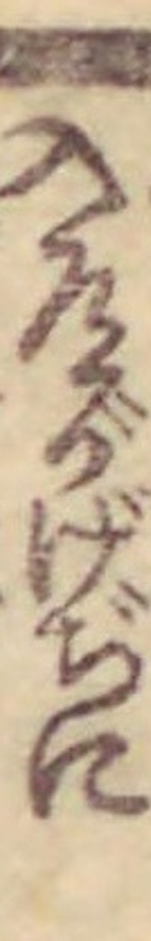入道がげぢに
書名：化物世帯氣質
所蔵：国立国会図書館 National Diet Library, JAPAN
